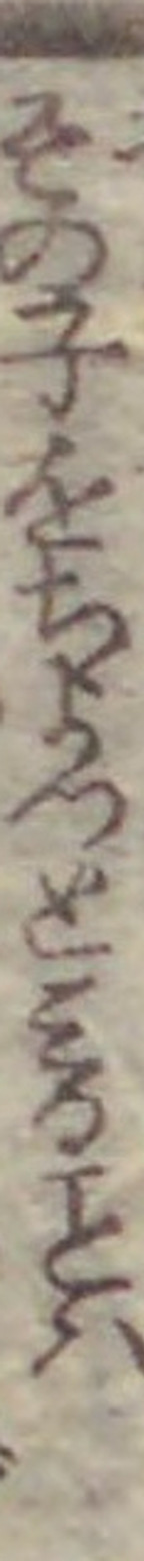その子をちよつとみることは
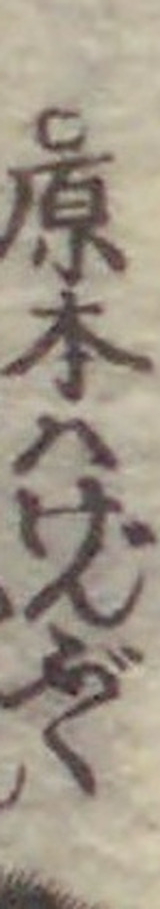○原本はげんぶく
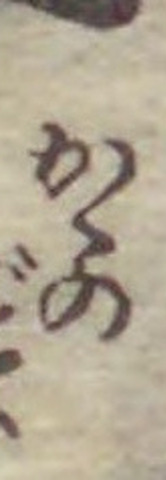かくの
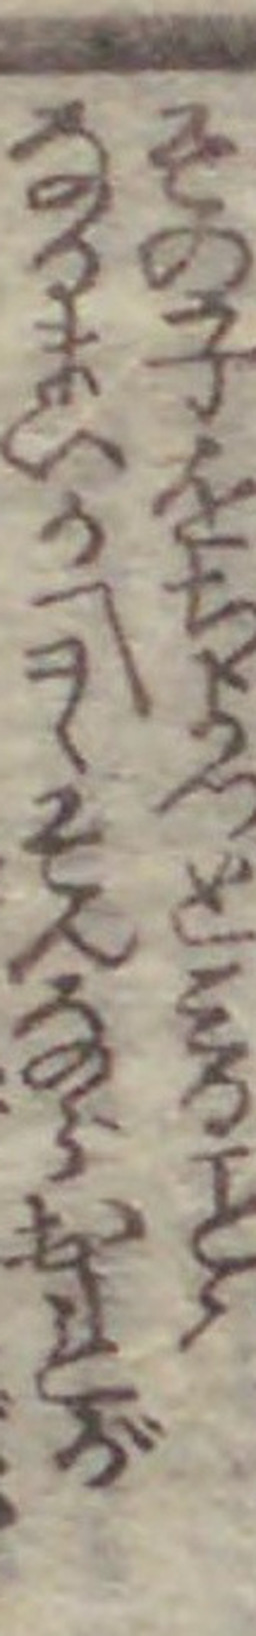なるまいか〽ヲヽそんならおれが
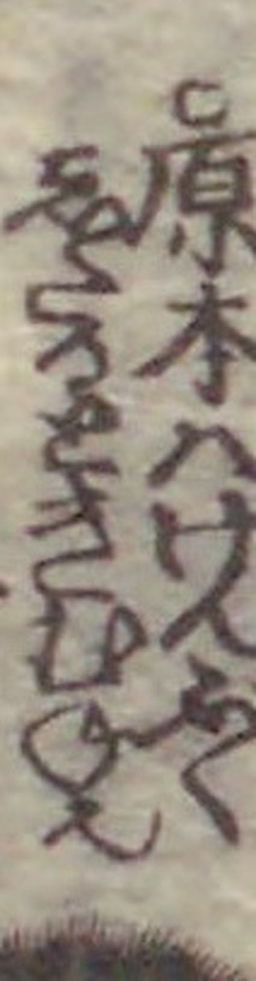したるときむね也
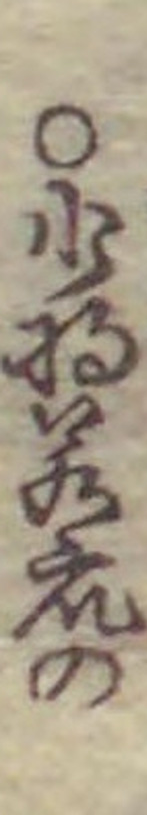○少将若衆の
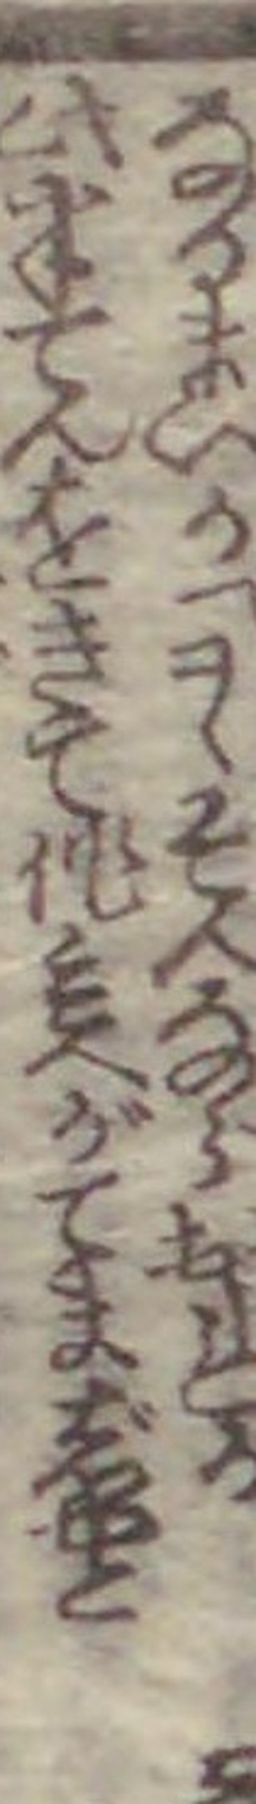此半てんをきて作兵衛がてまじやと
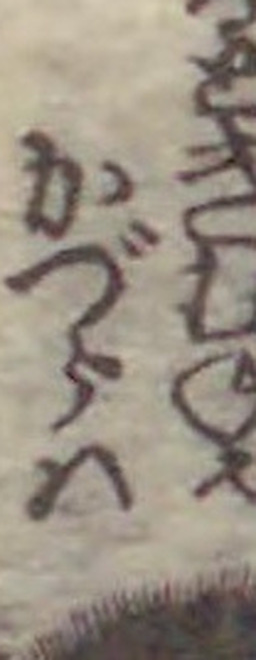かづらは
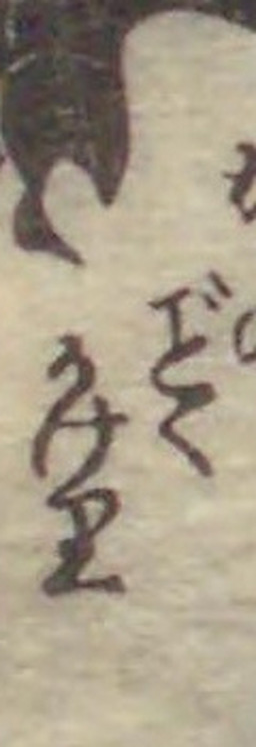かけり
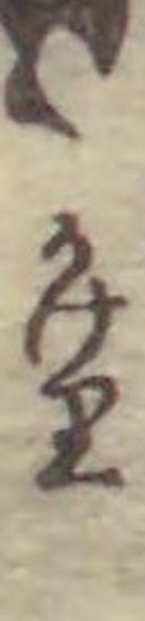かけり
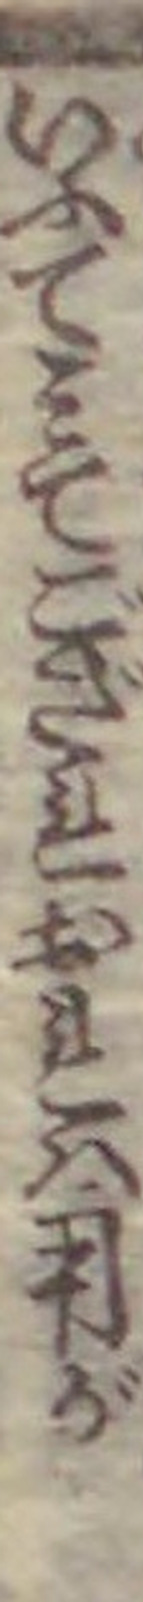いふてみてござれおれは用が
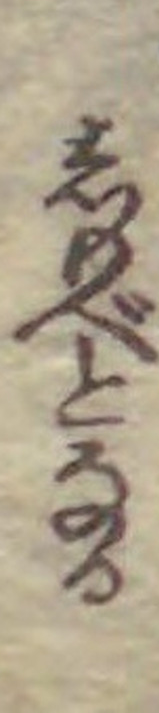しもべとなる
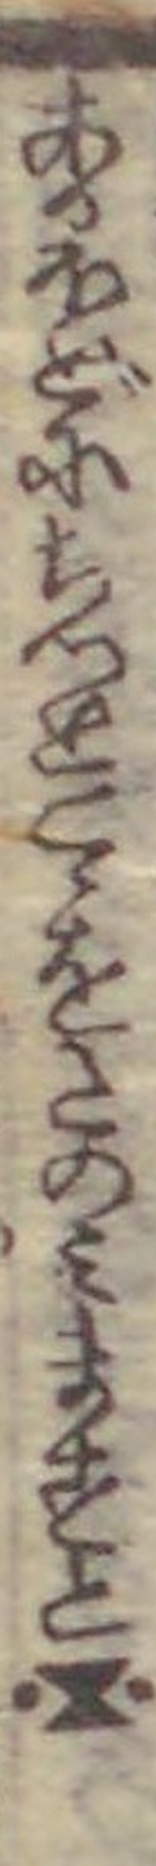あるほどにちつとこゝをたのみますと▼▲

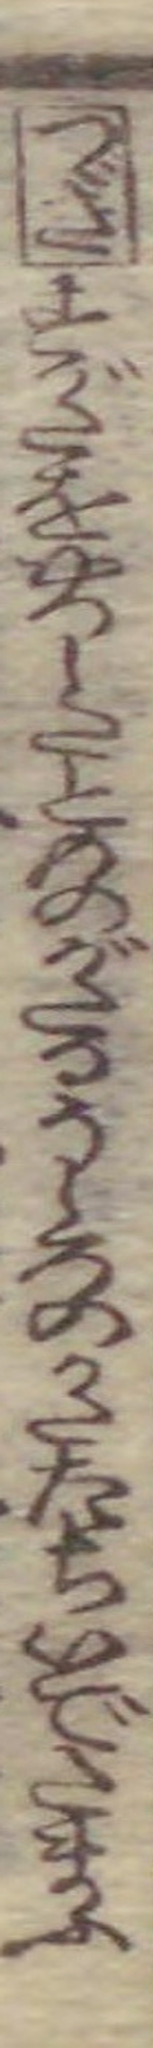つゞきすがたをやつしたとものがたるうしろのかたたちいでたまふ
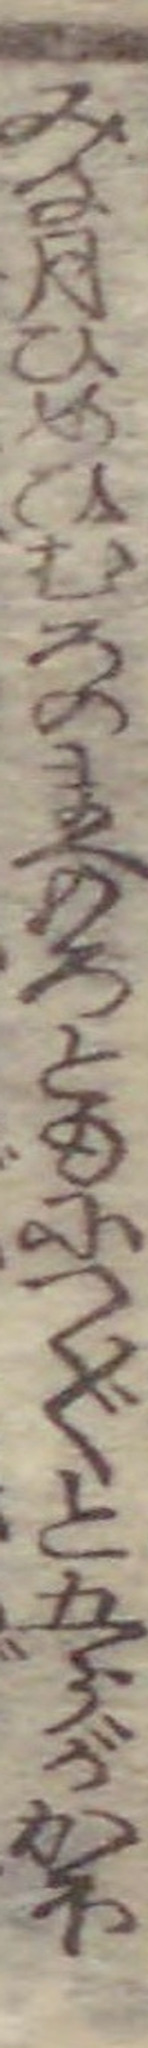みな月ひめはむろのまへもろともにつく〴〵と五郎がかほ
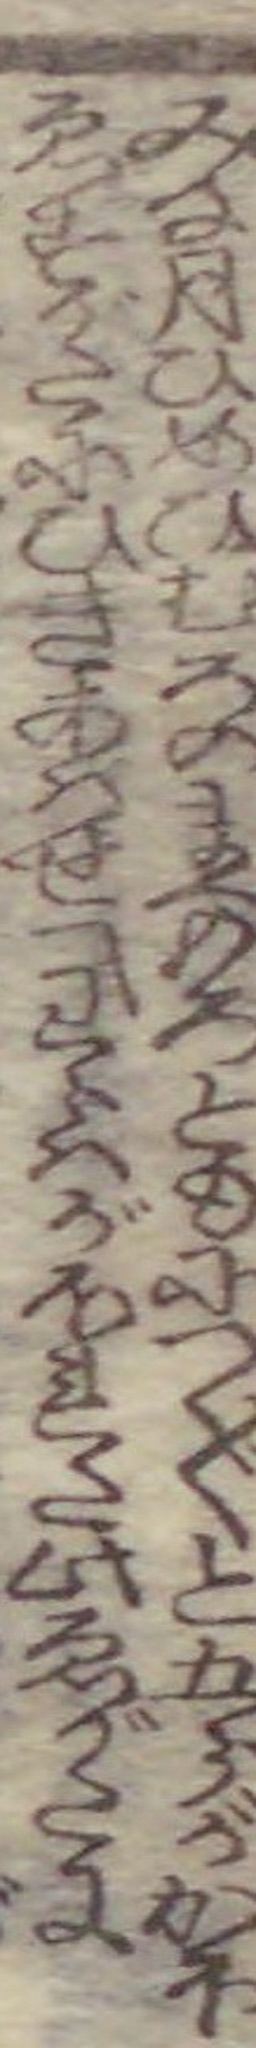ゑすがたにひきあはせ〽わらはがほれた此ゑがたに
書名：大時代唐土化物 3巻. 曽我太夫染
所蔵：国立国会図書館 National Diet Library, JAPAN
